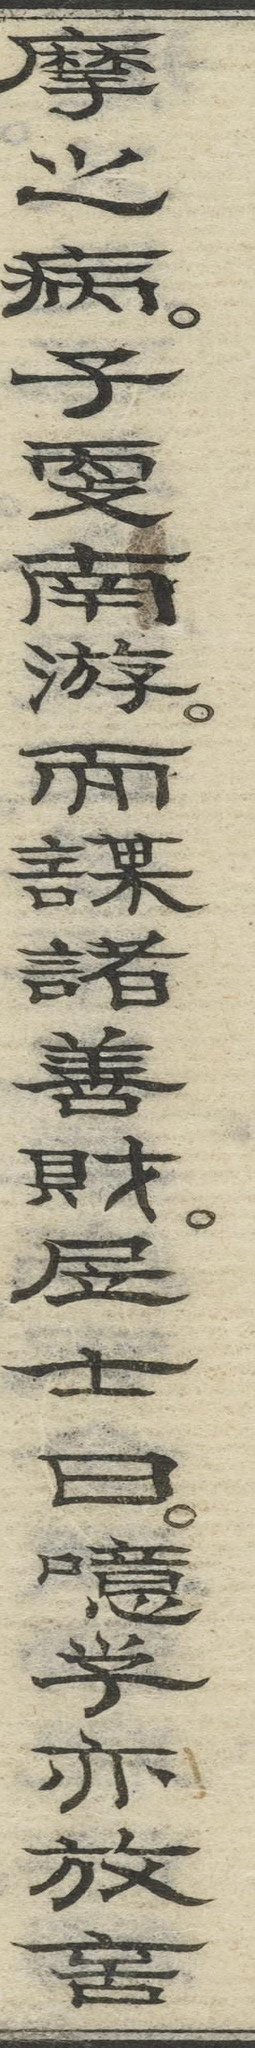摩之病。子南游。而謀諸善財。居士曰。噫呼亦放言
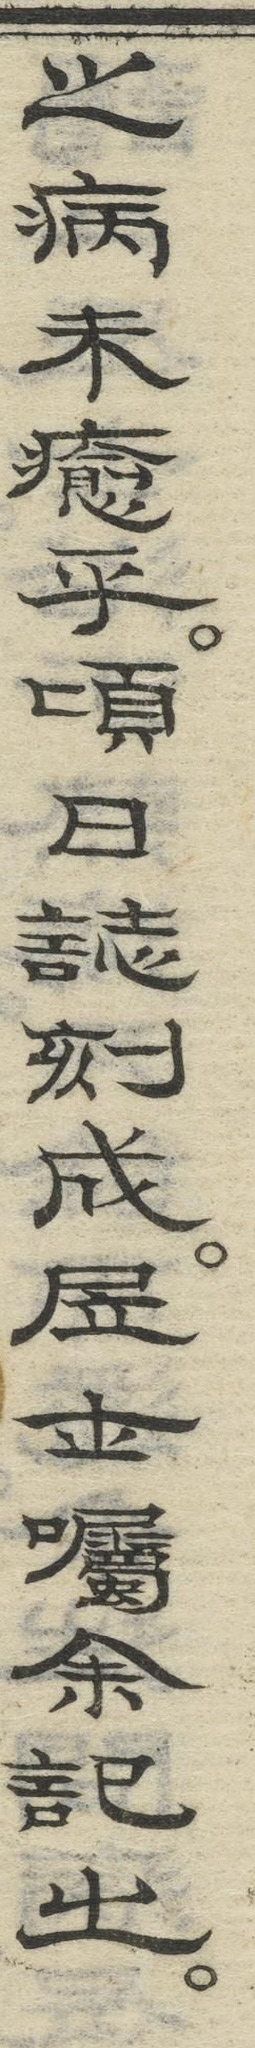之病未癒乎。頃日誌刻成。居士嘱余記出。
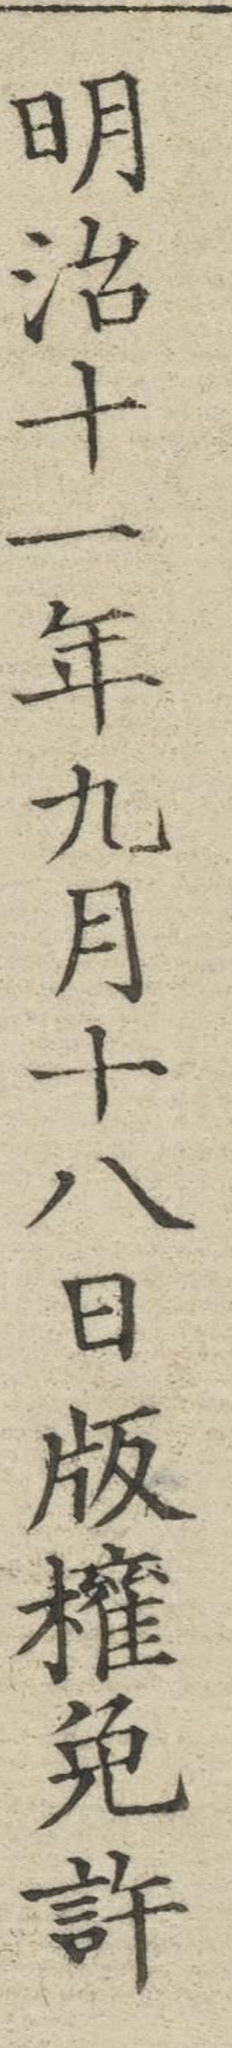明治十一年九月十八日版権免許
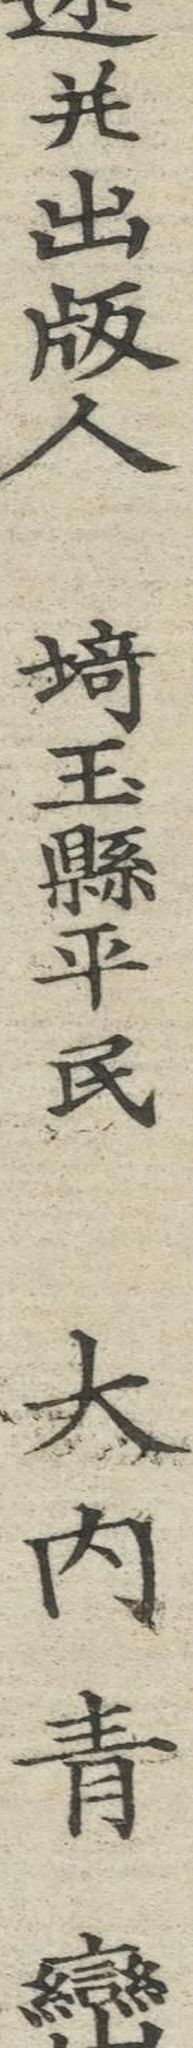著述并出版人埼玉県平民大内青巒
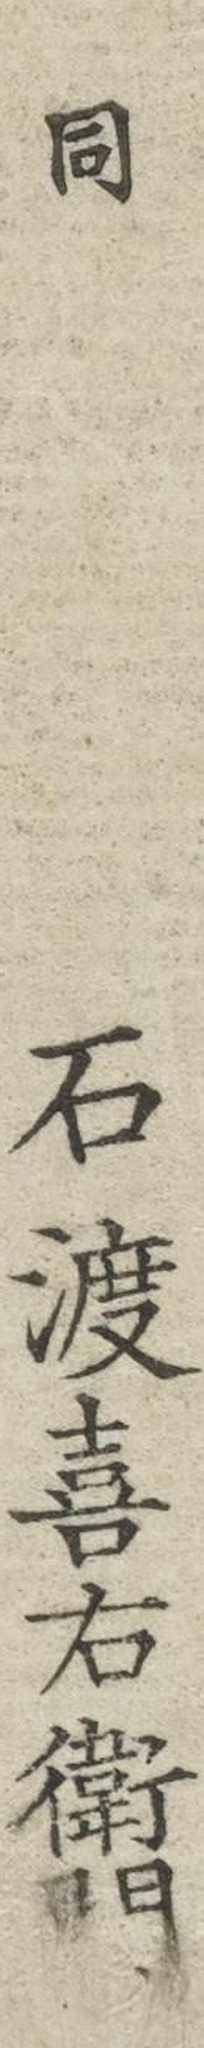同同石渡喜右衛門
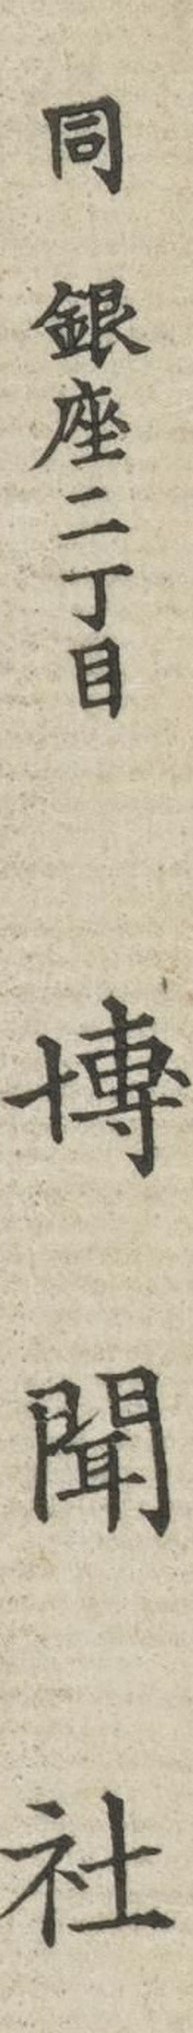同同銀座二丁目博聞社
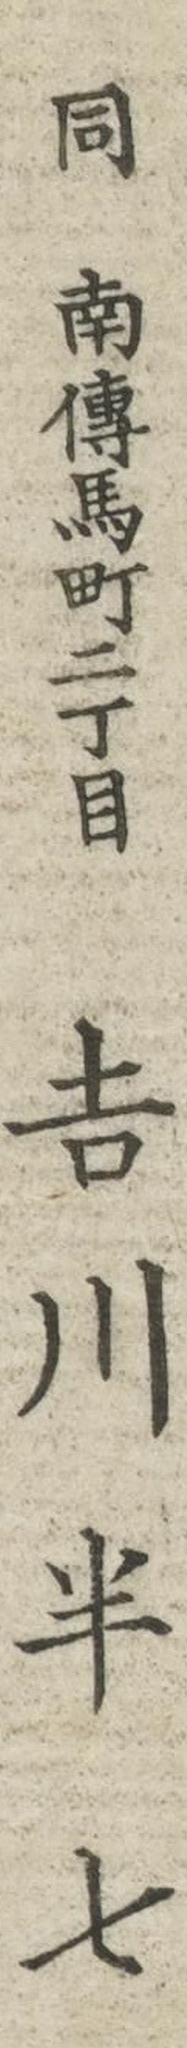同同南伝馬町二丁目吉川半七
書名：豆州熱海誌　完
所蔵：東京大学地震研究所図書室 Earthquake Research Institute Library, The University of Tokyo, JAPAN
